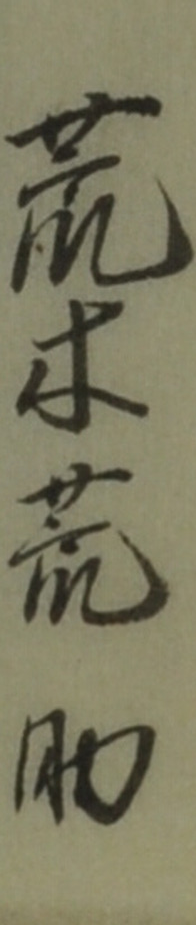荒木荒助
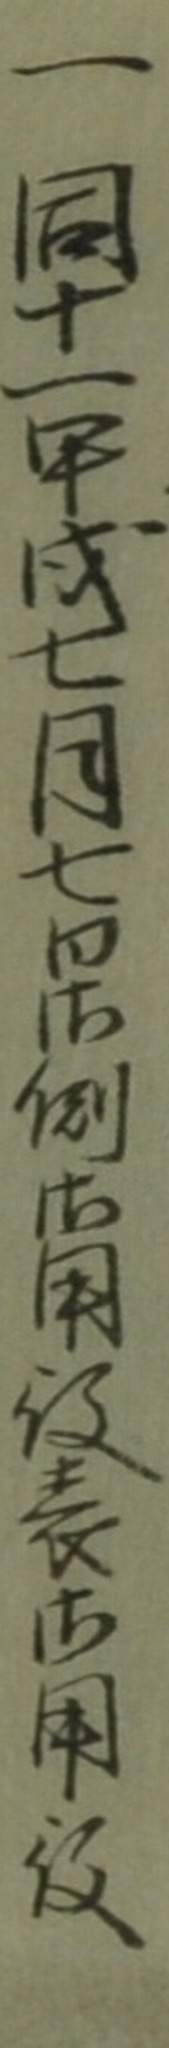一同十一甲戌七月七日御側御用役表御用役
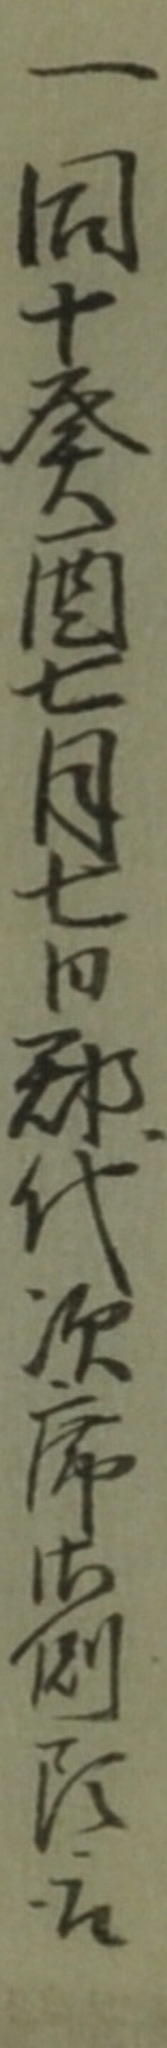一同十癸酉七月七日郡代次席御側頭取
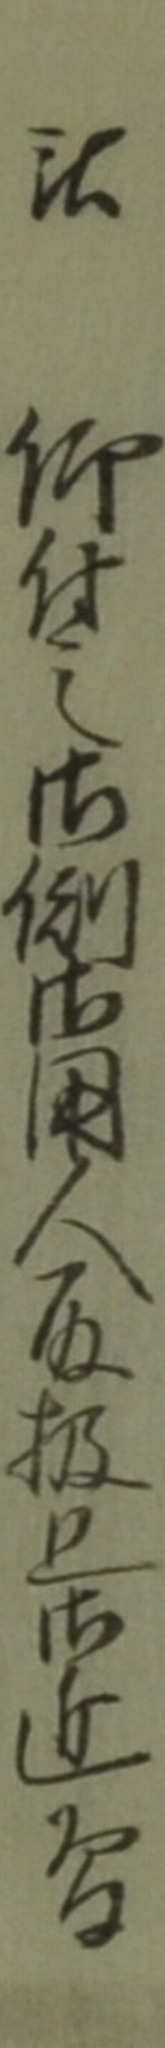被仰付之御側御用人取扱御近習
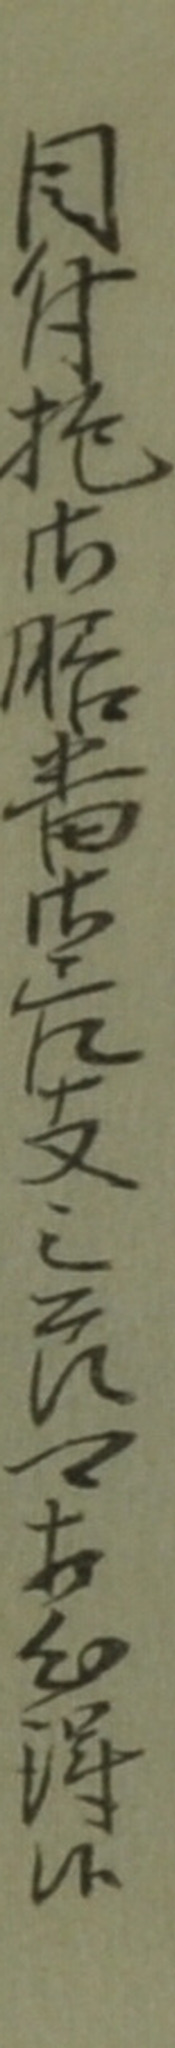目付抱御膳番御差支之節可相心得候
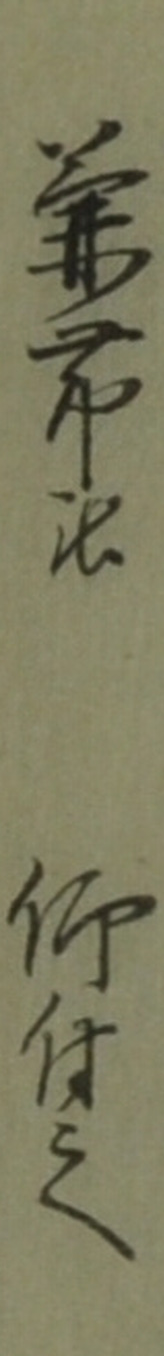兼帯被仰付之
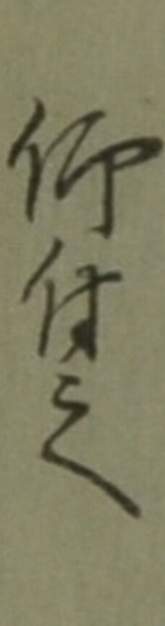仰付之
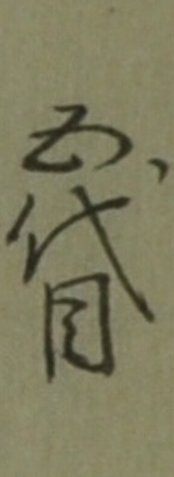五代目
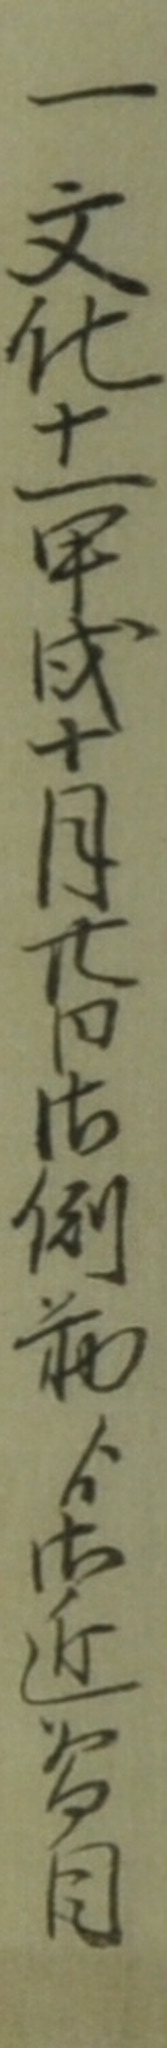一文化十一甲戌十月廿日御側勤ゟ御近習目
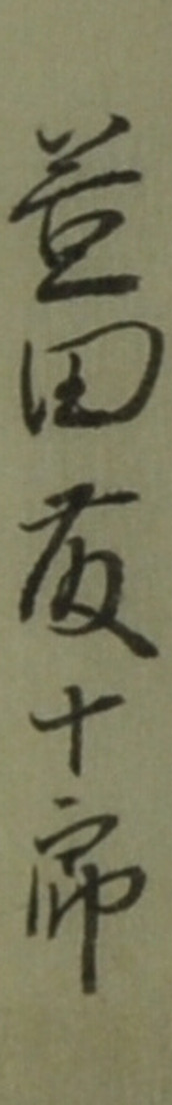益田藤十郎

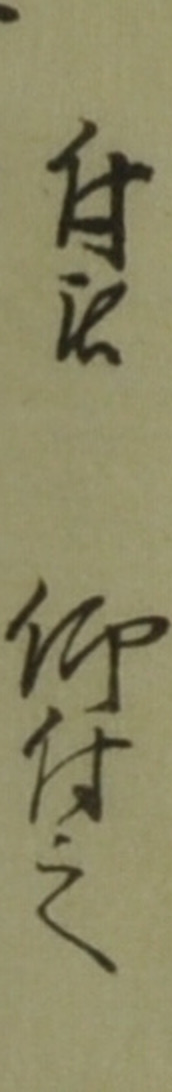付被仰付之
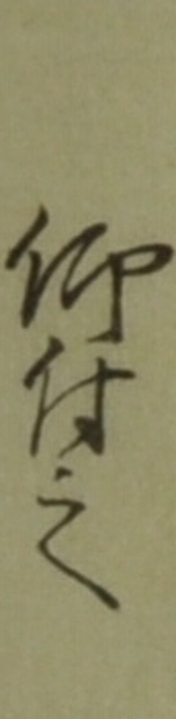仰付之
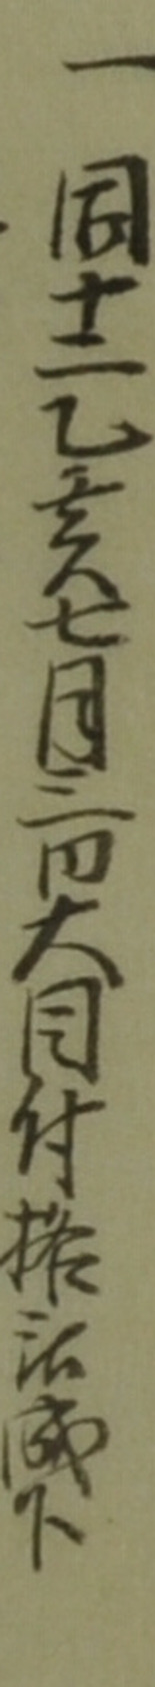一同十二乙亥七月三日大目付格被成下
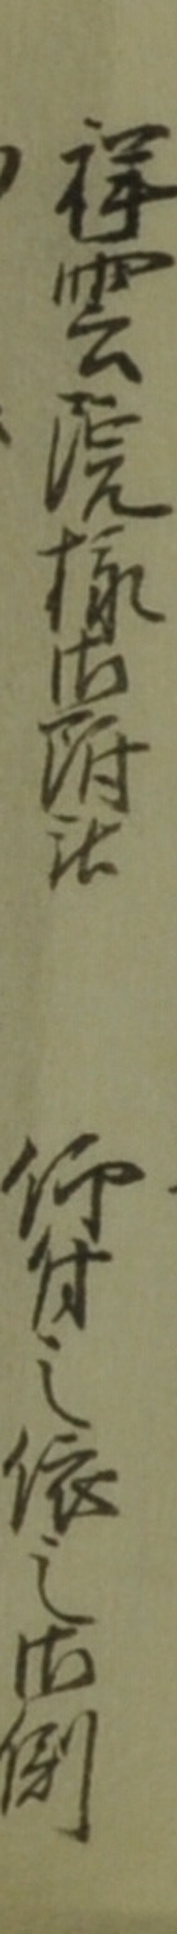祥雲院様御附被仰付之依之御側
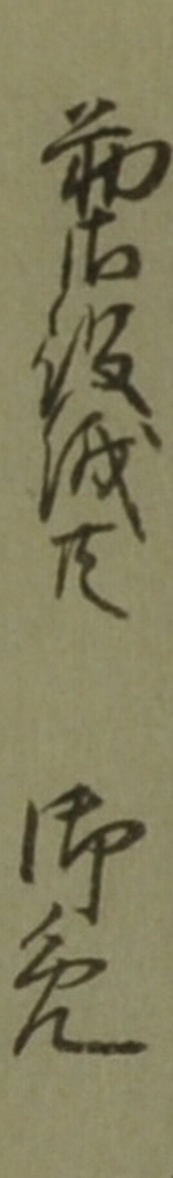勤御役儀共御免
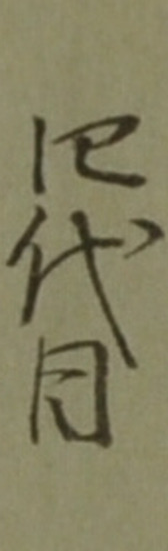四代目
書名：諸御役代々録（四）
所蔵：伊那市立高遠町図書館・合同会社AMANE
